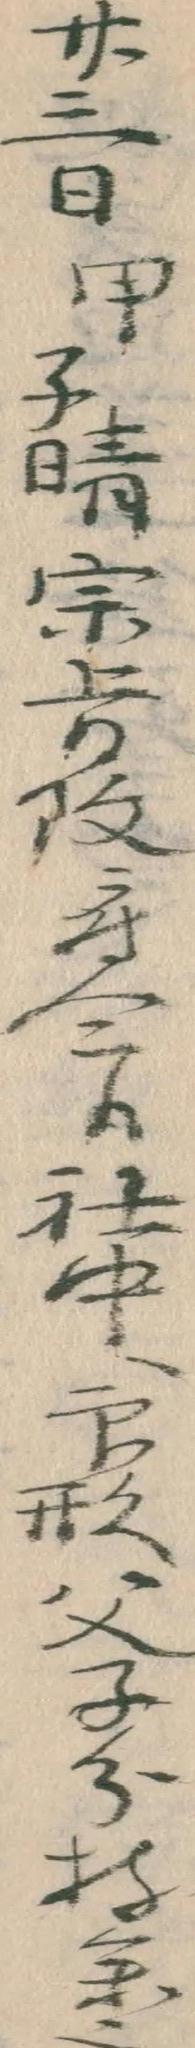廿三日甲子晴宗旨改ニ付今日社中へ印形父子分持参也
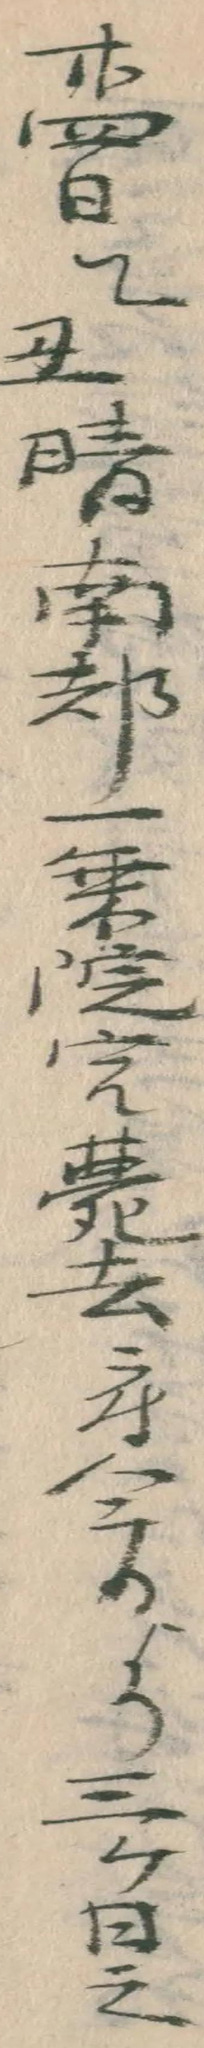廿四日乙丑晴南都一乗院宮薨去ニ付今日より三ヶ日之
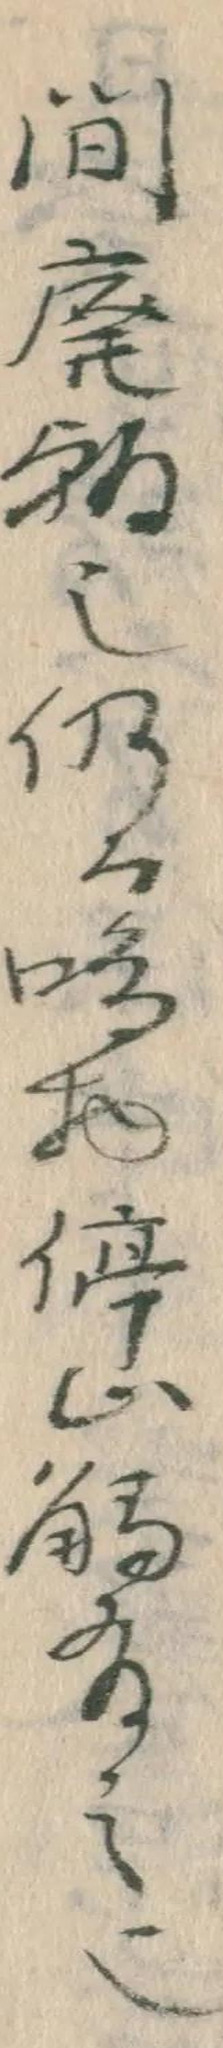間廃朝也仍而鳴物停止触有之也
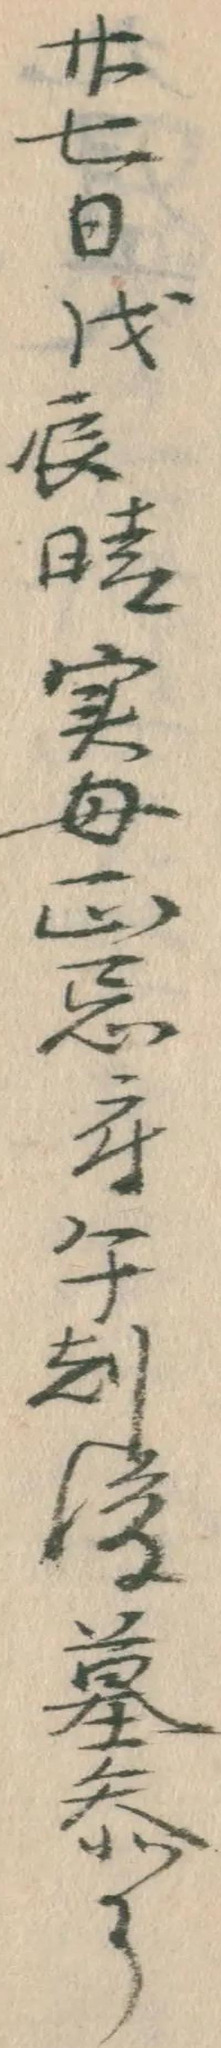廿七日戊辰晴実母正忌ニ付午刻後墓参了
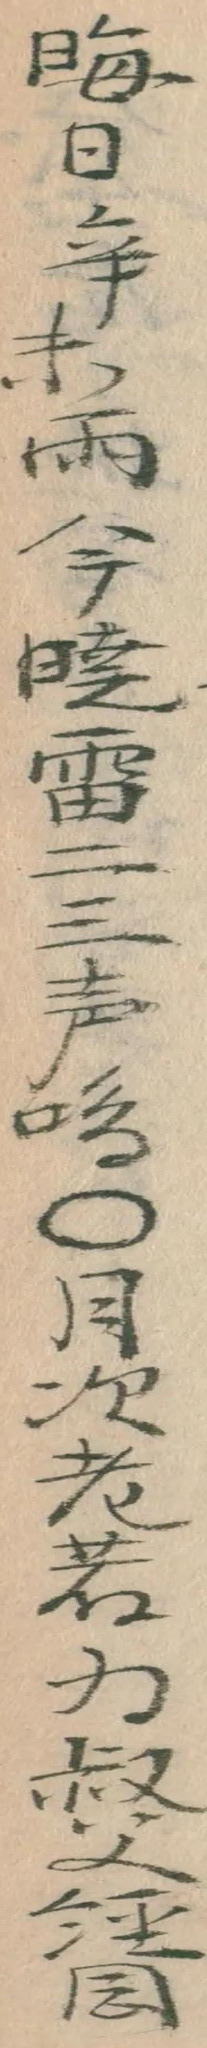晦日辛未雨今暁雷二三声鳴◯月次老若為叔父経国

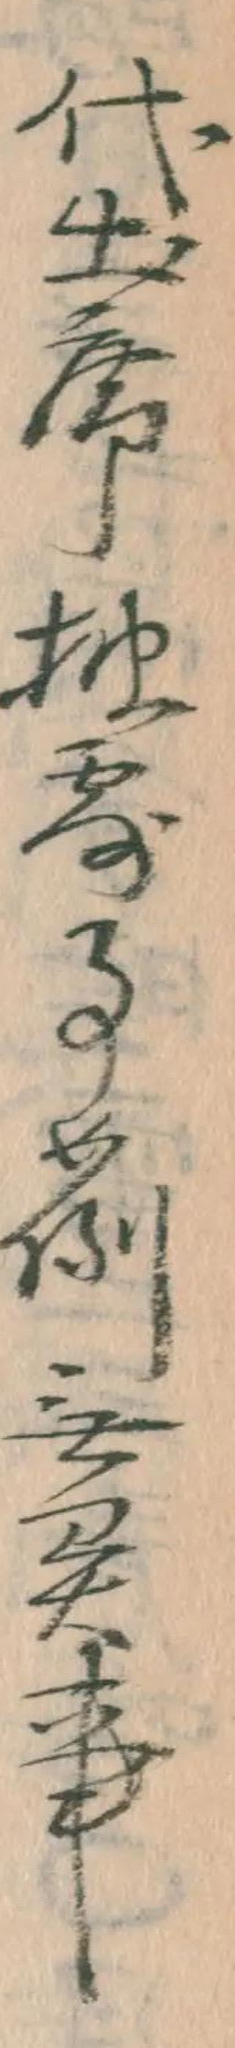代出席被露事如例無異事
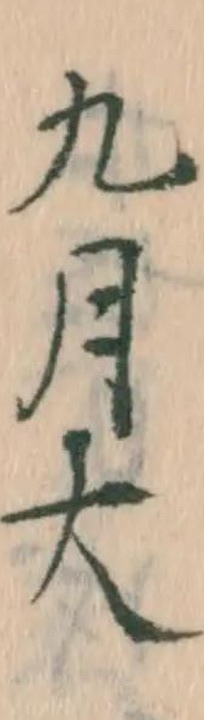九月大
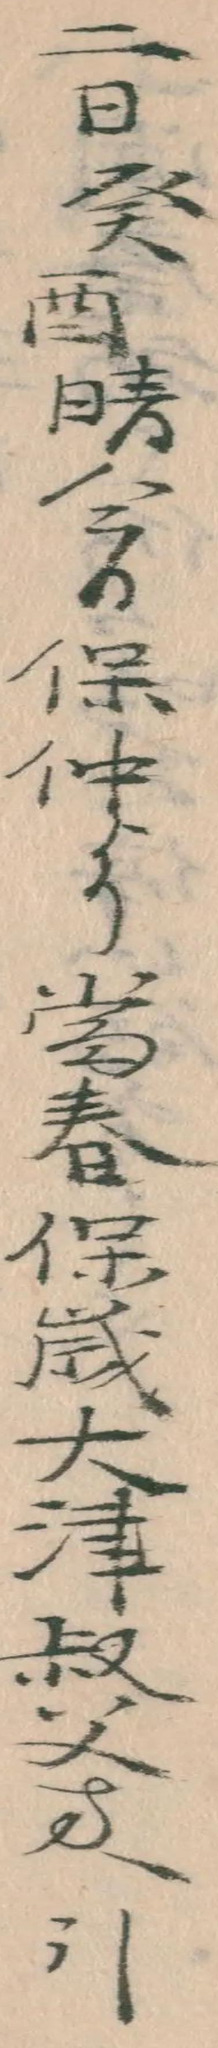二日癸酉晴今日保仲より當春保歳大津叔父方へ引
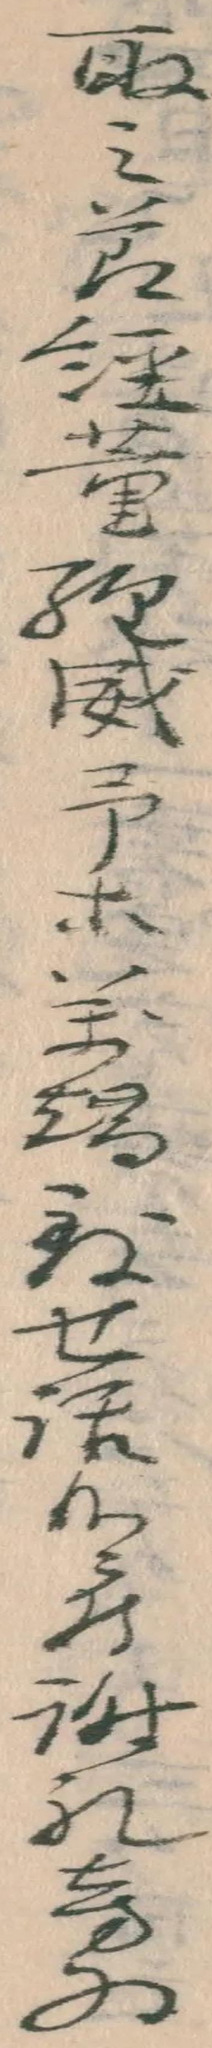取之節経董経威予等万端致世話候ニ付謝礼旁為
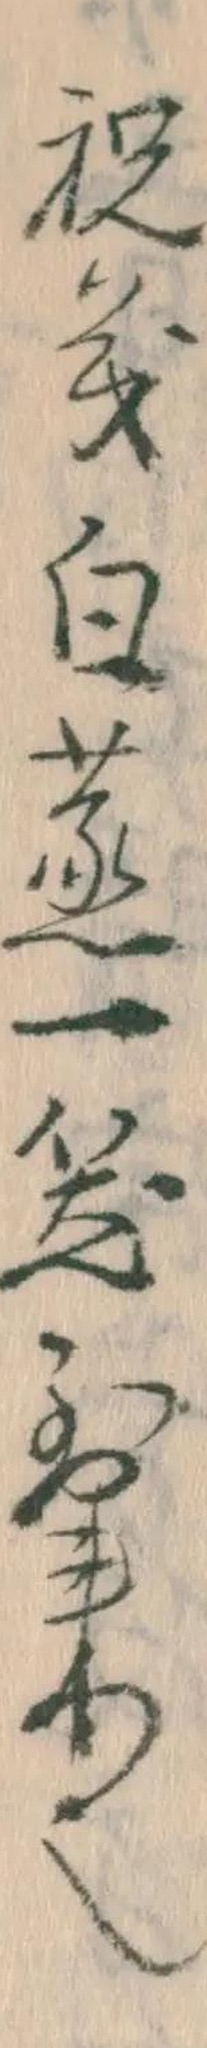祝義白蒸一笑到来也
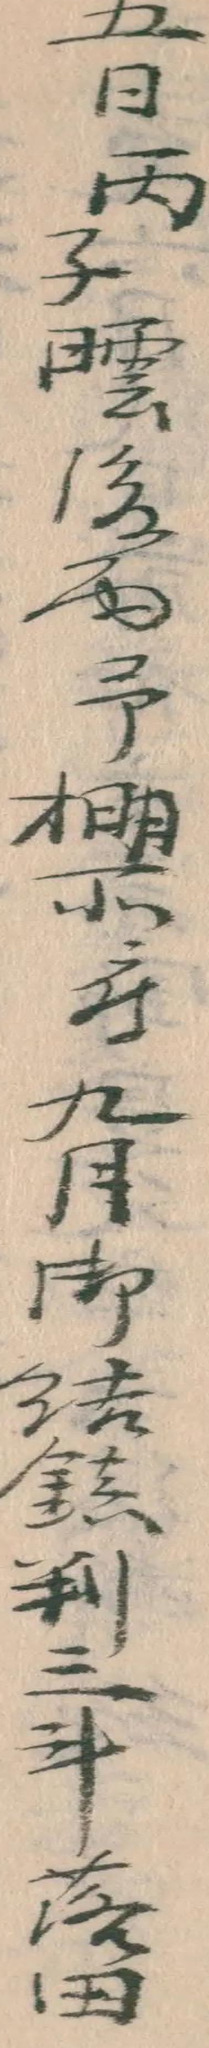五日丙子曇後雨予棚所ニ付九月御結鎮判三斗落田
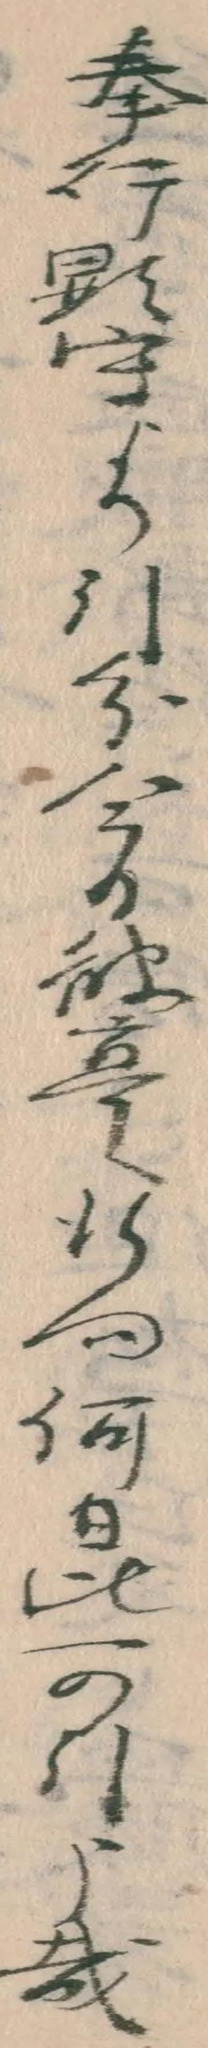奉行顕守より引分今日彼亭へ行向何日比可引申哉
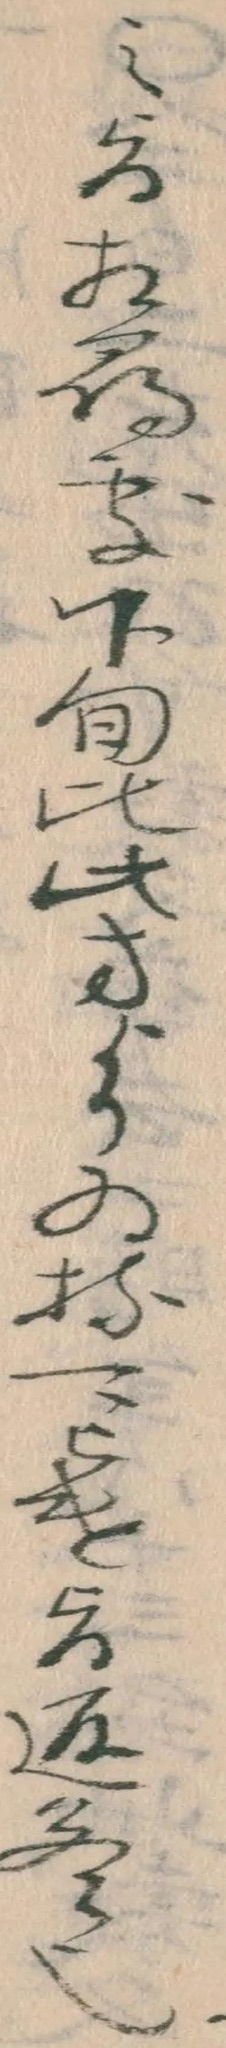之旨相尋處下旬比此方より為持可被遣旨返答也
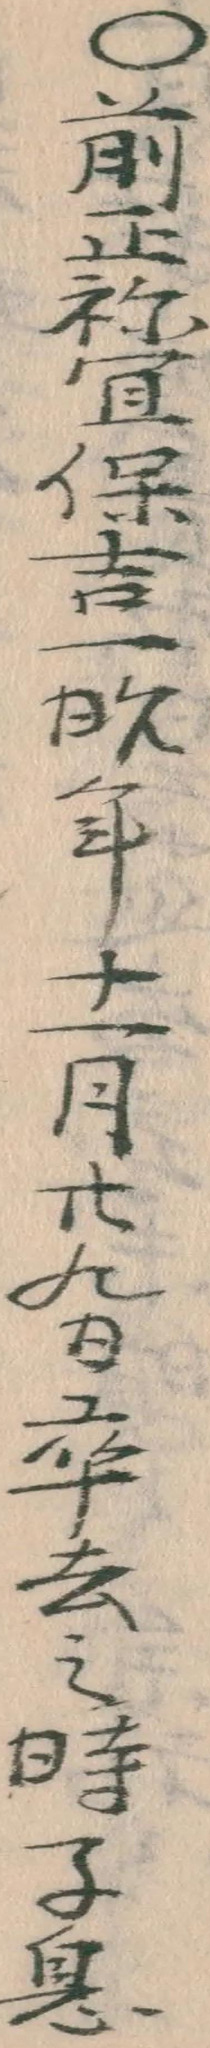○前正称宜保吉一昨年十一月廿九日卒去之時子息
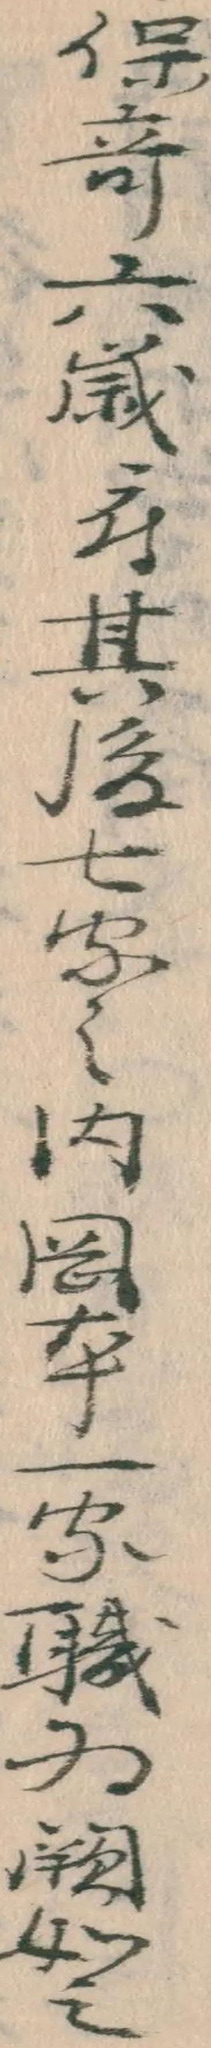保竒六歳ニ付其後七家之内岡本一家職為闕如之
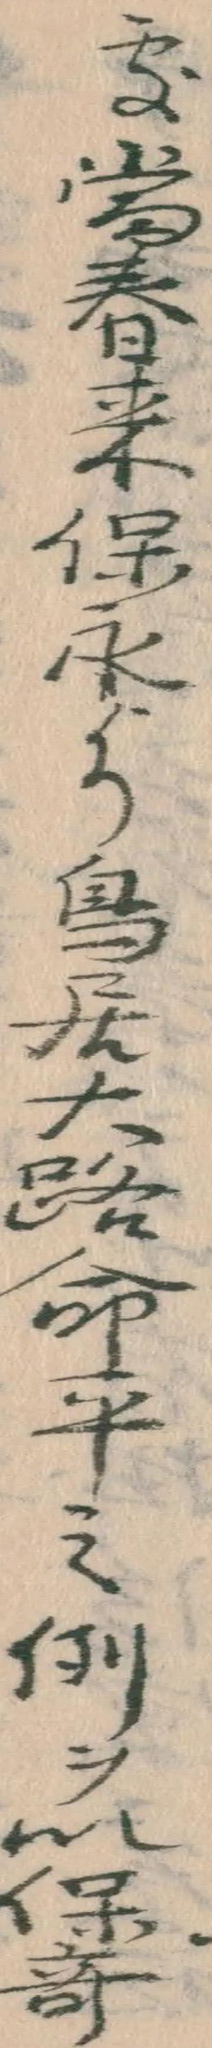處當春来保永より鳥居大路命平之例を以保竒
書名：賀茂社記録. 第63冊
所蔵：国立国会図書館 National Diet Library, JAPAN
